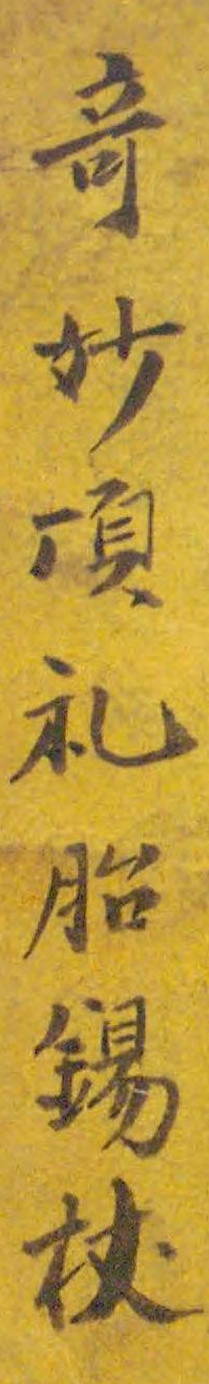奇妙頂礼胎錫杖

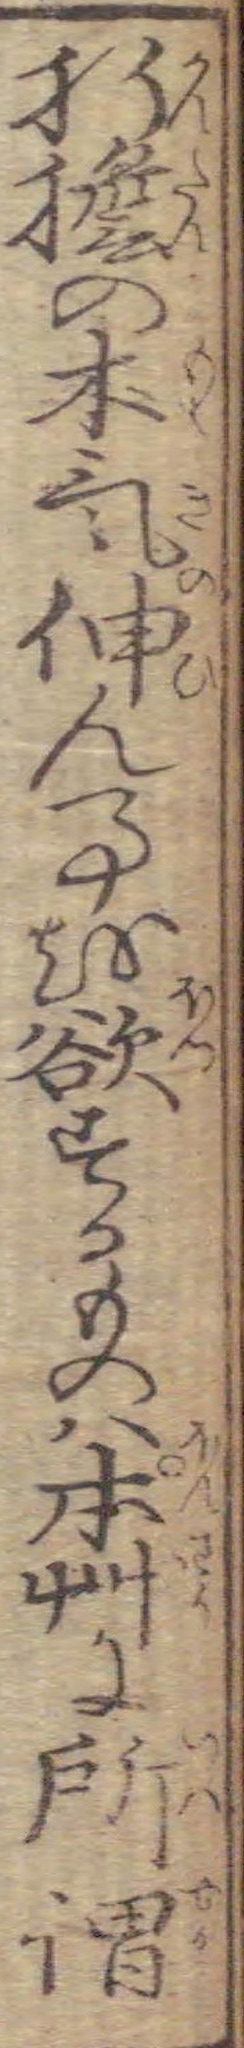肝胆の木気伸ん事を欲するものは。本艸に所謂
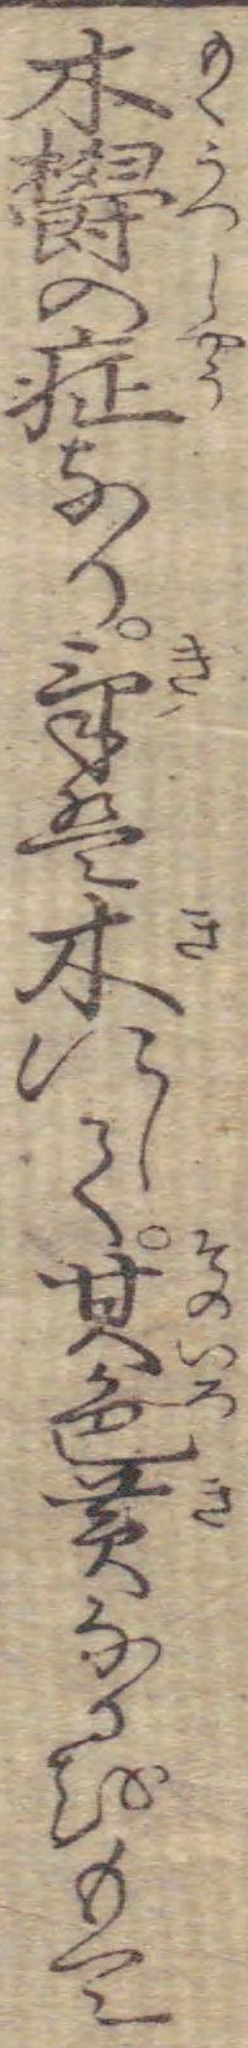木欝の症なり。気は木にして。其色黄なるをもて
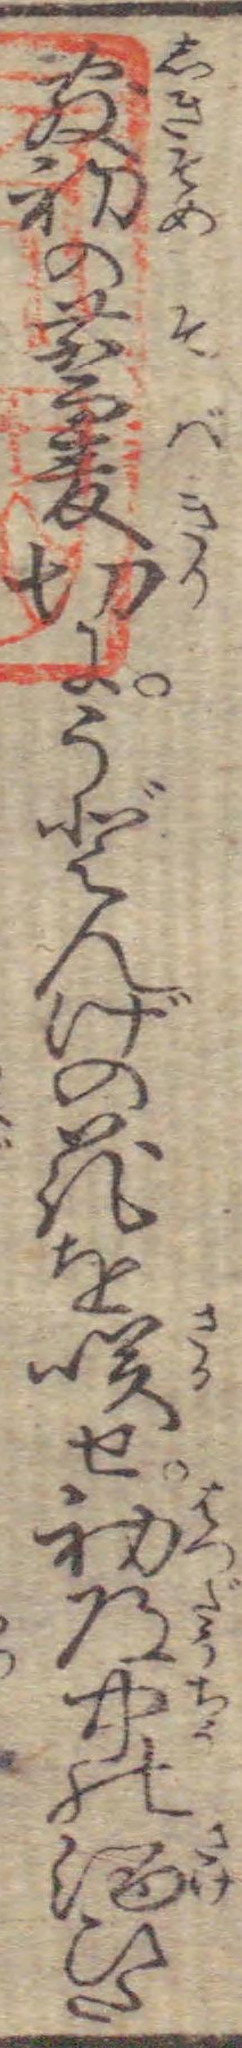敷初の蕎麦切に。うどんげの花を咲せ。初道中の酒ひた
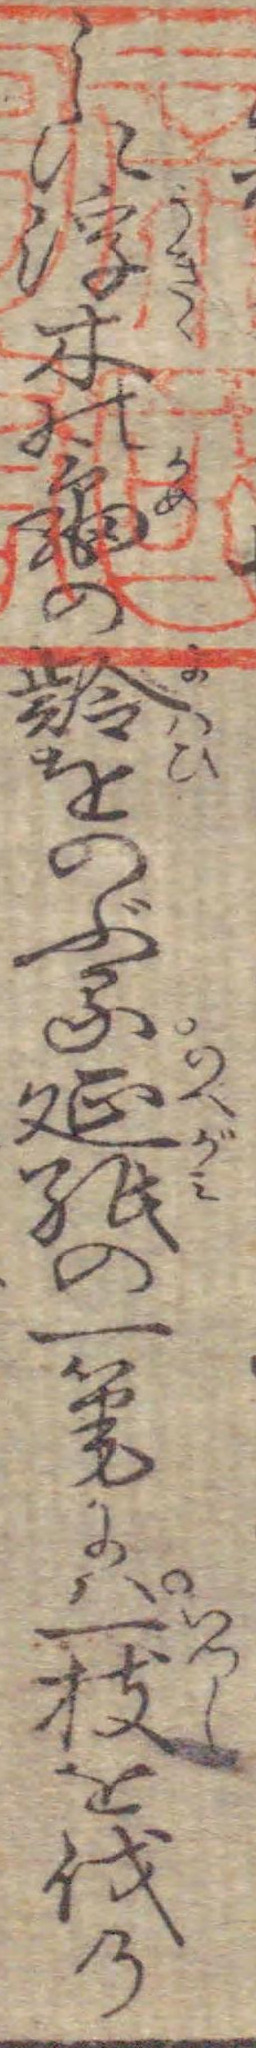しに浮木の亀の齢をのぶる延紙の一筆には。一枝を伐の
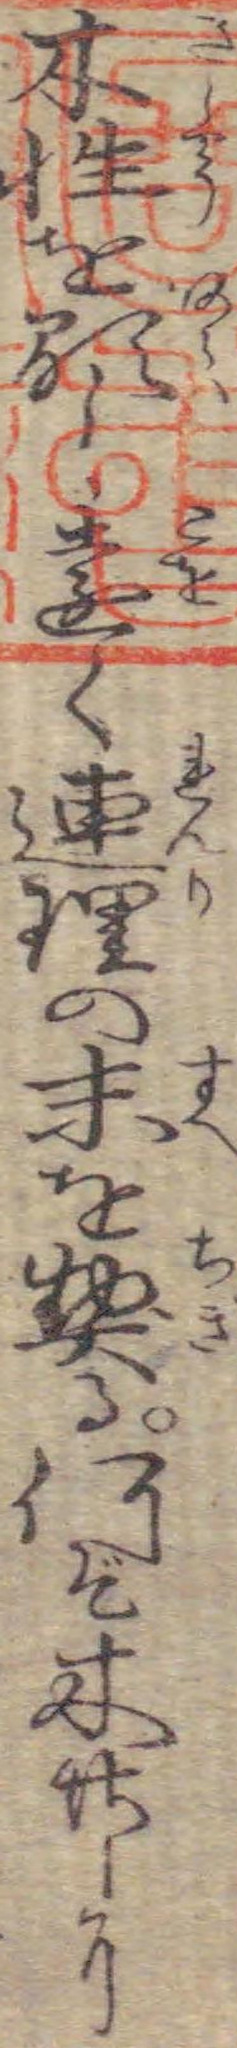木性を顕し遠く連理の末を契る。何ぞ木さしに
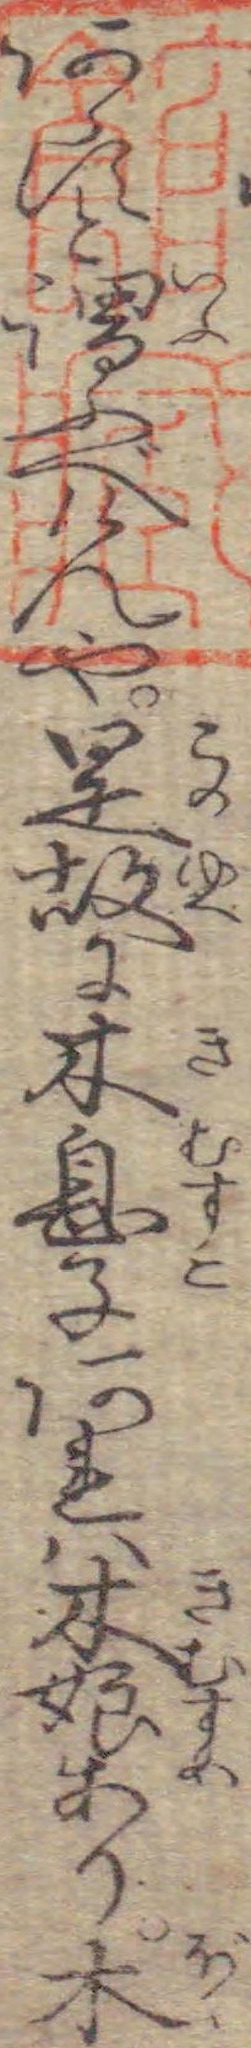あらすと謂ふへけんや。是故に木息子あれは木娘あり。木
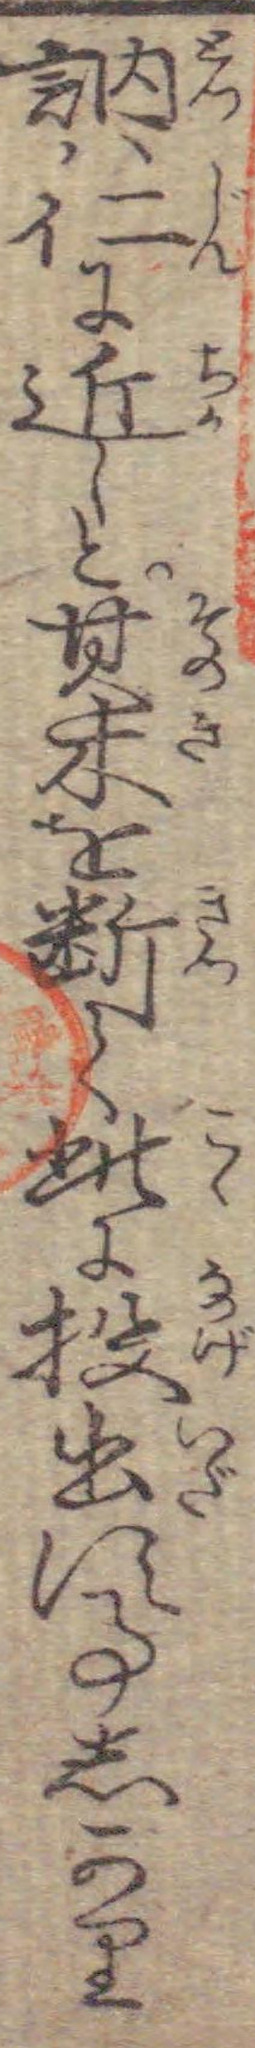訥は仁に近しと。其木を断て此に投出す事しかり

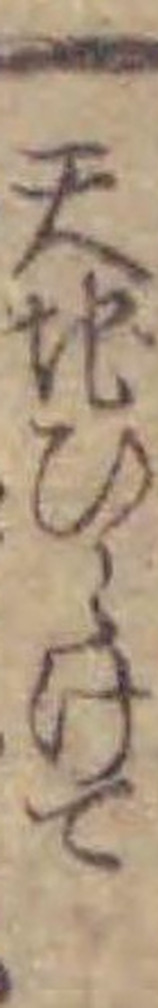天地ひらけて
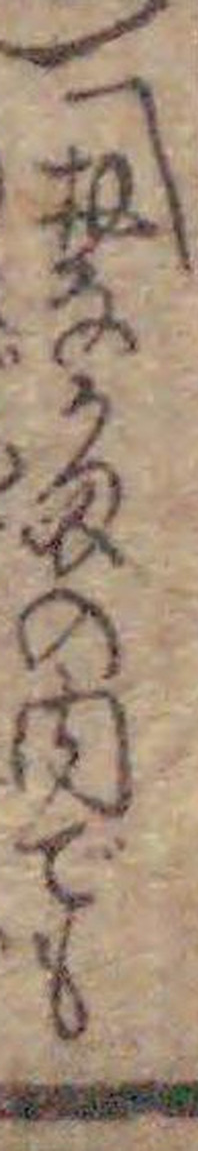〽おなかまの内でも
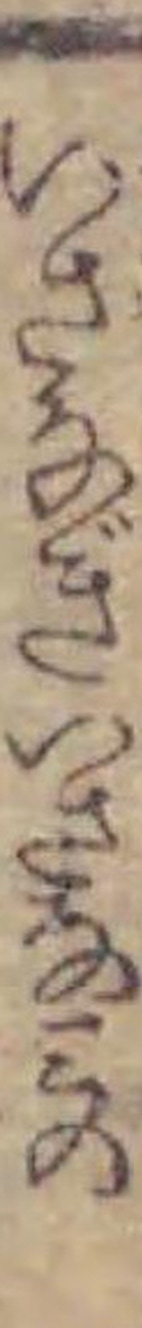いさなぎいさなみの
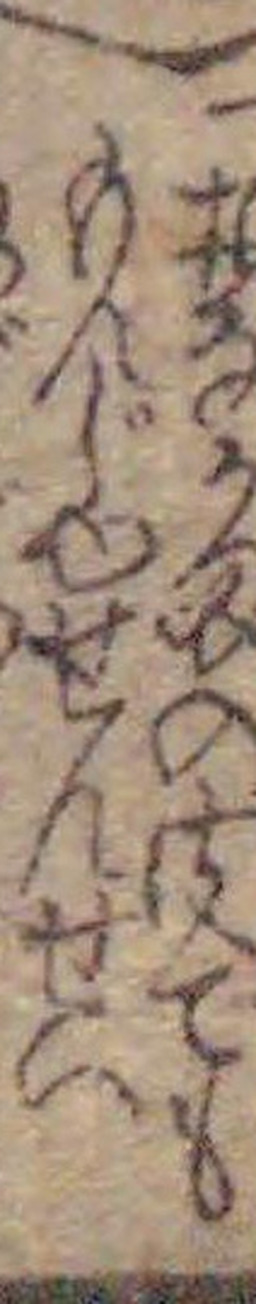もんじゆせんせい
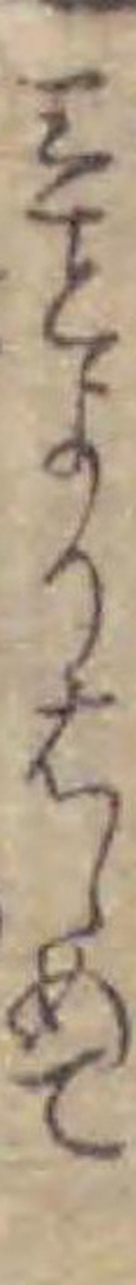みことよりはしめて
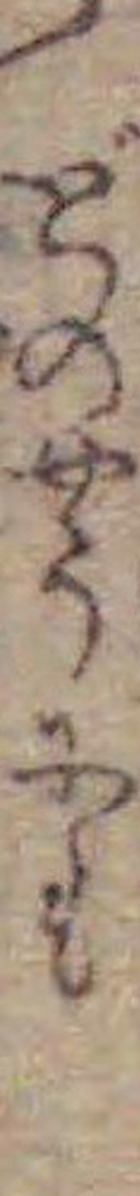どのやうにも
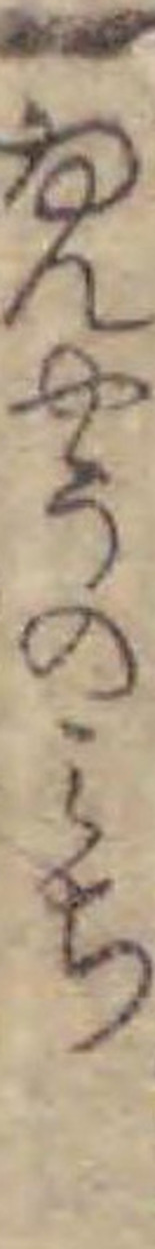ゐんやうのみち
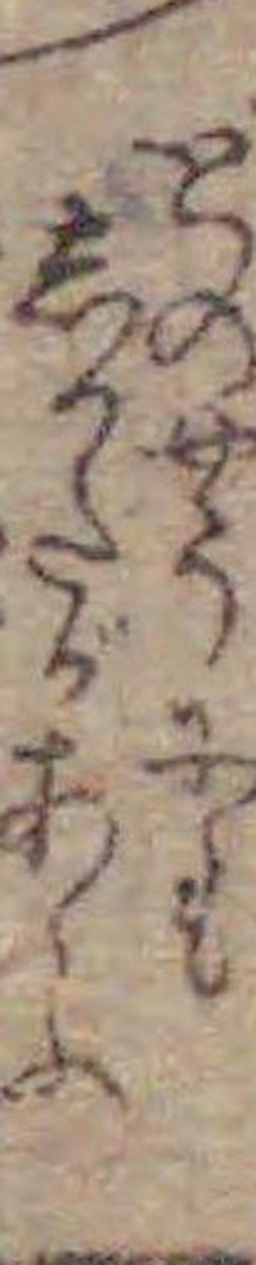しかたがあらふ
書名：奇妙頂礼胎錫杖 : 3巻
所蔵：国立国会図書館 National Diet Library, JAPAN
